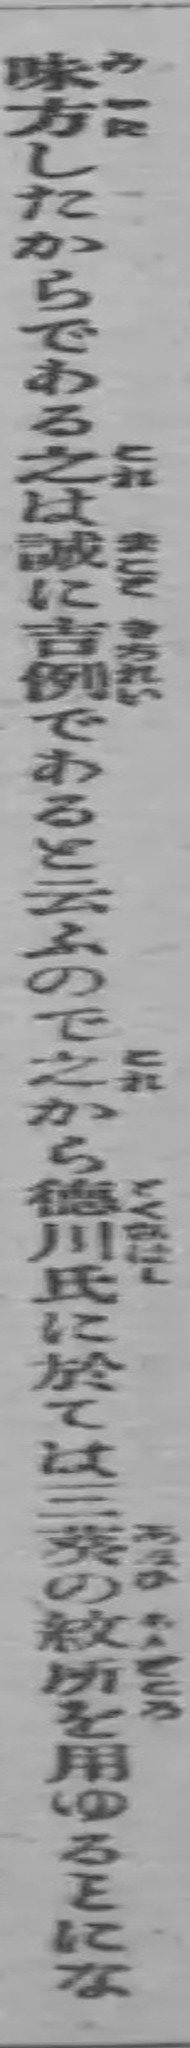味方したからである之は誠に吉例であると云ふので之から徳川氏に於ては三葵の紋所を用ゆることにな
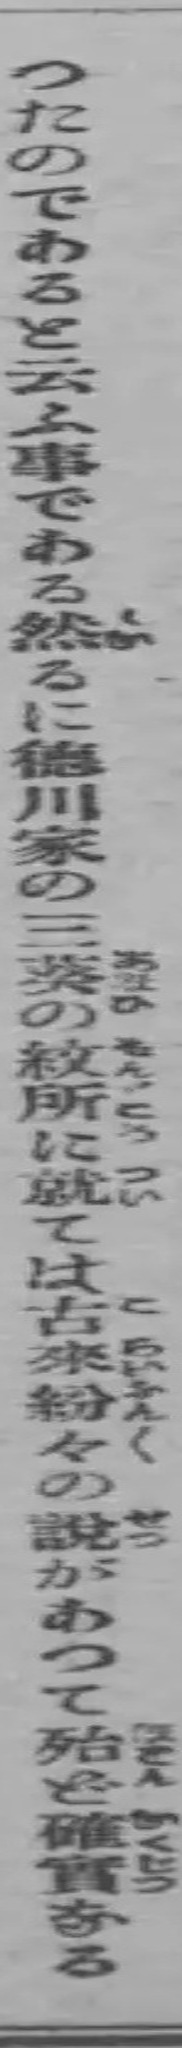つたのであると云ふ事である然るに徳川家の三葵の紋所に就ては古来紛々の説があつて殆ど確実なる
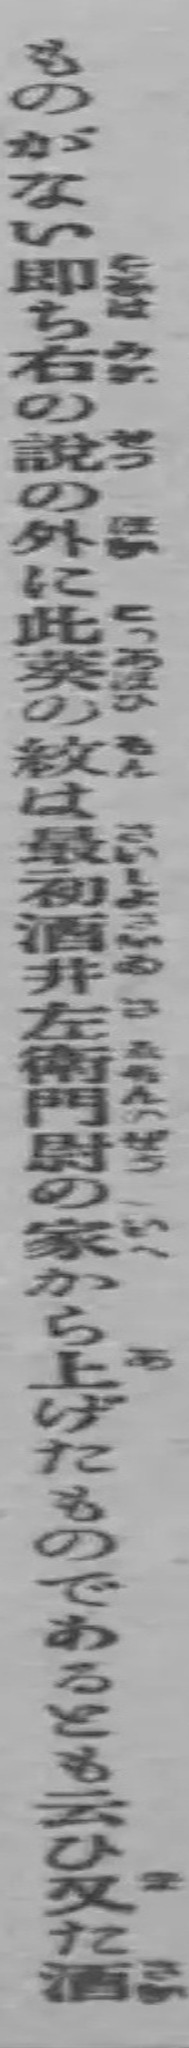ものがない即ち右の説の外に此葵の紋は最初酒井左衛門尉の家から上げたものであるとも云ひ又た酒
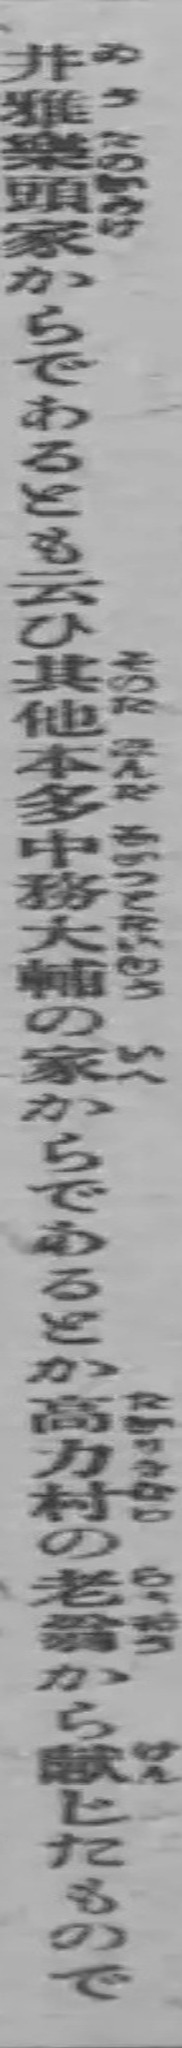井雅樂頭家からであるとも云ひ其他本多中務大輔の家からであるとか高力村の老翁から献じたもので
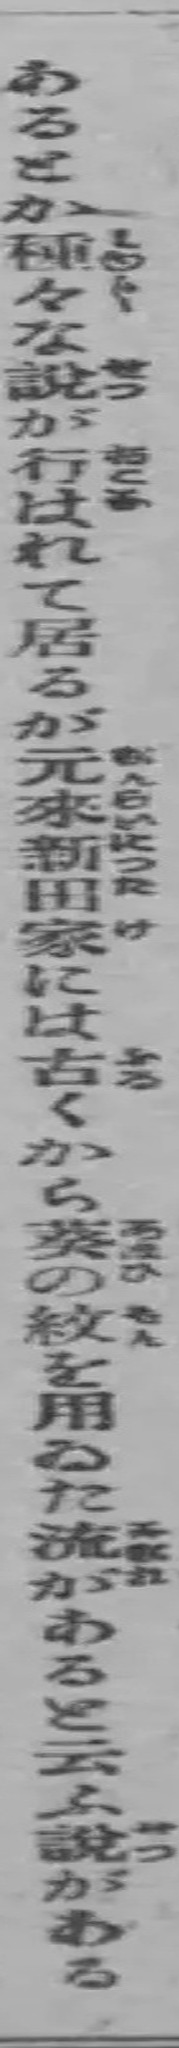あるとか種々な説が行はれて居るが元来新田家には古くから葵の紋を用ゐた流があると云ふ説がある
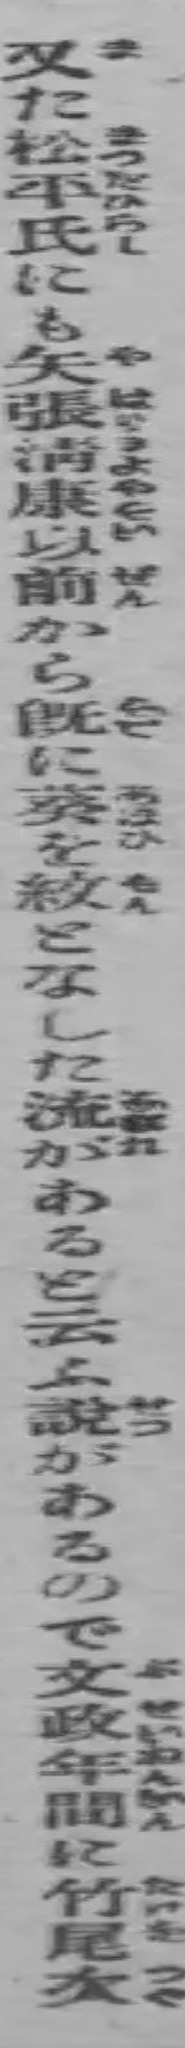又た松平氏にも矢張清康以前から既に葵を紋となした流があると云ふ説があるので文政年間に竹尾次
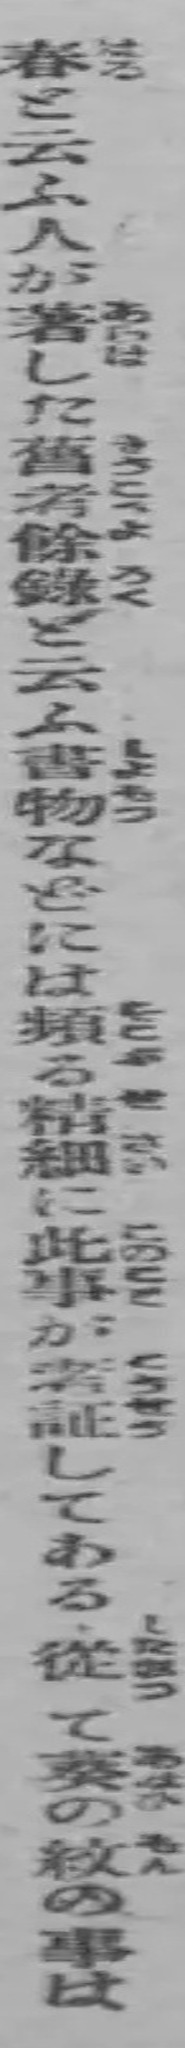春と云ふ人が著した旧考余録と云ふ書物などには頗る精細に此事が考証してある従て葵の紋の事は
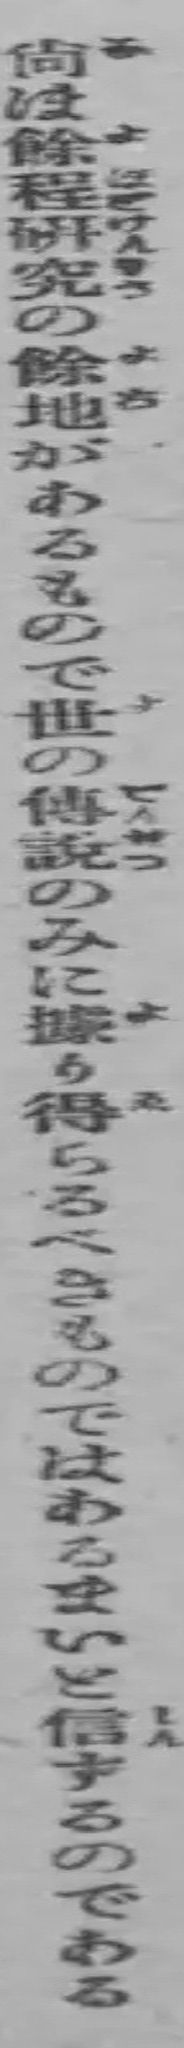尚ほ余程研究の余地があるもので世の伝説のみに拠り得らるべきものではあるまいと信ずるのである
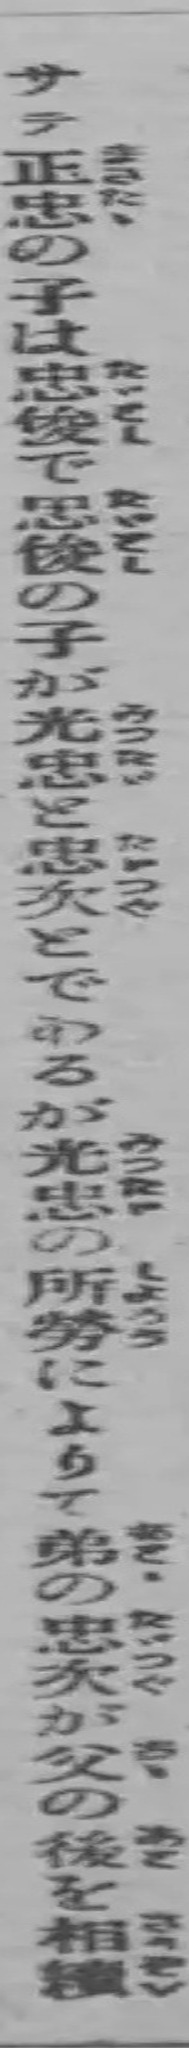サテ正忠の子は忠俊で忠俊の子が光忠と忠次とであるが光忠の所労によりて弟の忠次が父の後を相続
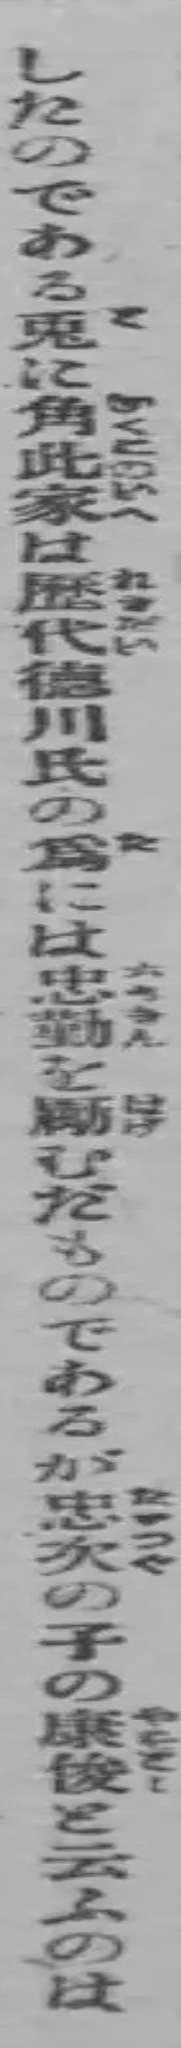したのである兎に角此家は歴代徳川氏の為には忠勤を励むだものであるが忠次の子の康俊と云ふのは
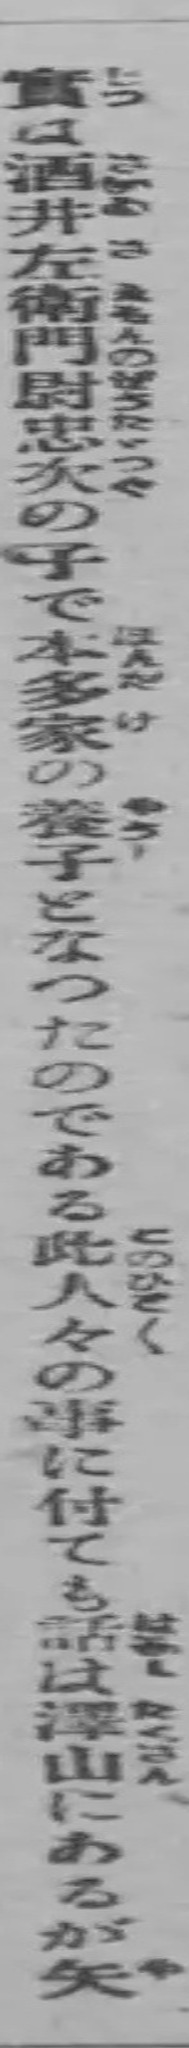実は酒井左衛門尉忠次の子で本多家の養子となつたのである此人々の事に付ても話は沢山にあるが矢
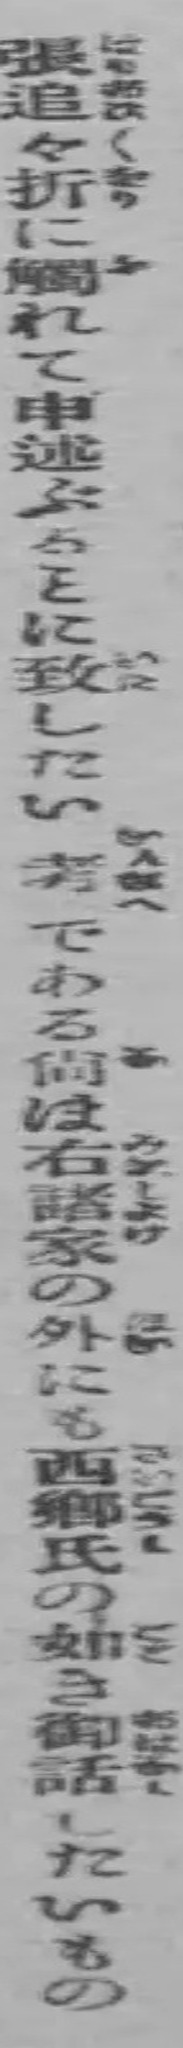張追々折に触れて申述ぶることに致したい考である尚ほ右諸家の外にも西郷氏の如き御話したいもの
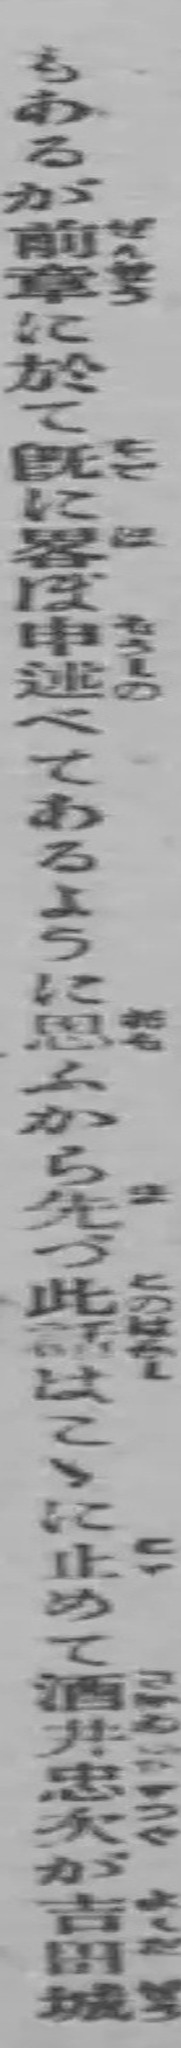もあるが前章に於て既に略ぼ申述べてあるように思ふから先づ此話はこゝに止めて酒井忠次が吉田城
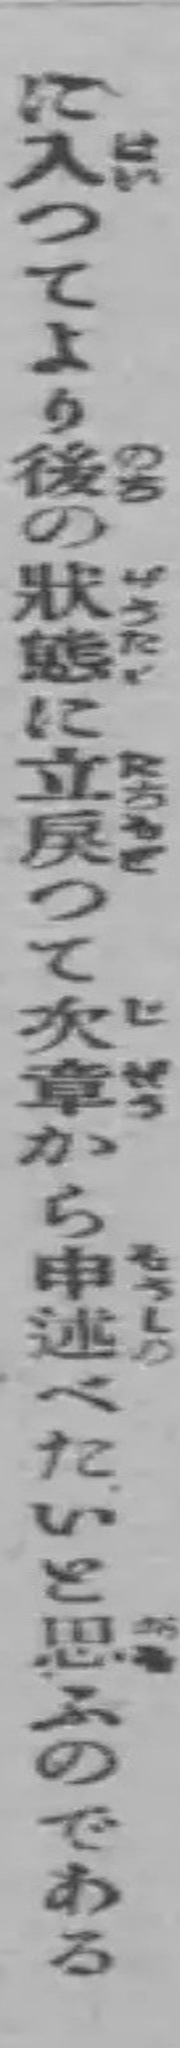に入つてより後の状態に立戻つて次章から申述べたいと思ふのである
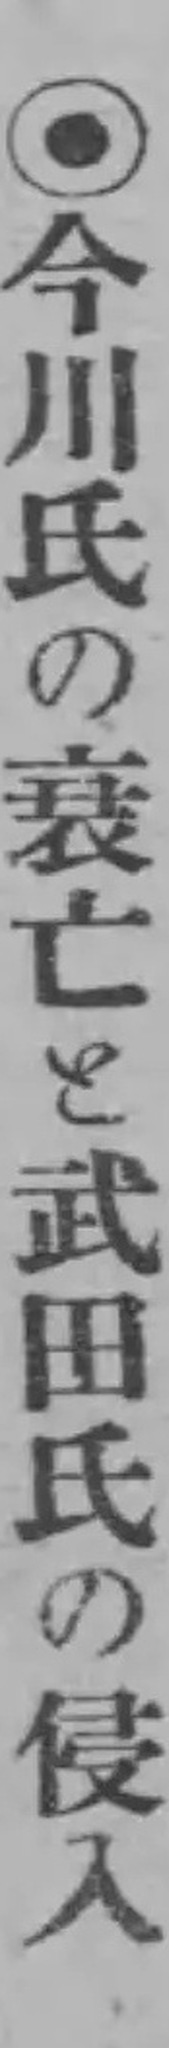⦿今川氏の衰亡と武田氏の侵入
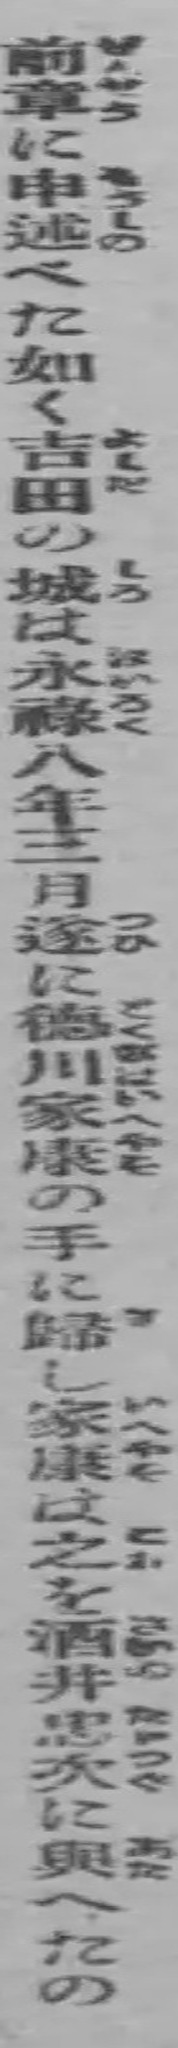前章に申述べた如く吉田の城は永禄八年三月遂に徳川家康の手に帰し家康は之を酒井忠次に与へたの
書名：豊橋市史談
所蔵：国立国会図書館 National Diet Library, JAPAN
